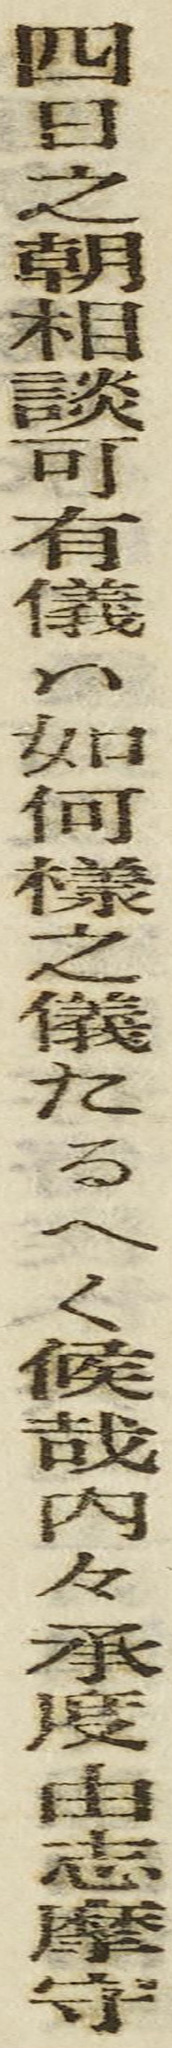四日之朝相談可有儀ハ如何樣之儀たるへく候哉内々承度由志摩守
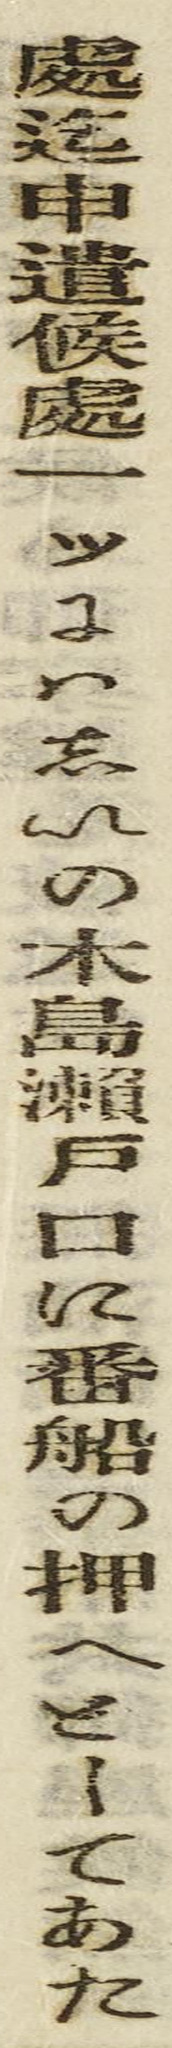処迄申遣候処一ツにハしいの木島瀬戸口に番船の押へとしてあた
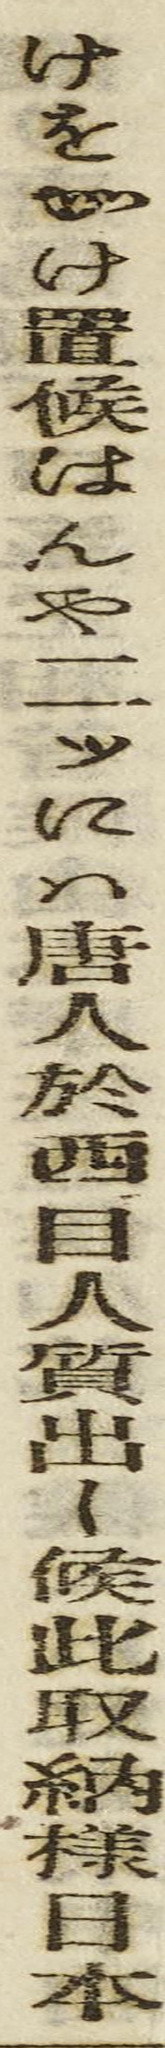けをかけ置候はんや二ツにハ唐人於西目人質出し候此取納樣日本
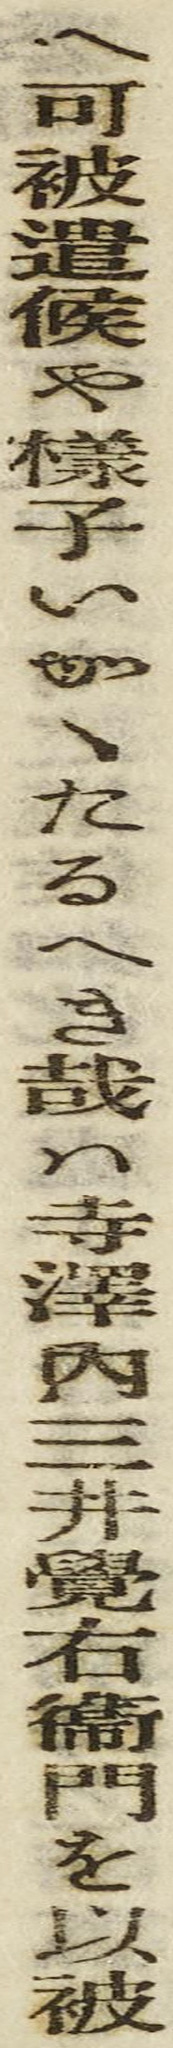へ可被遣候や様子いかゝたるへき哉ハ寺沢内三井覚右衛門を以被
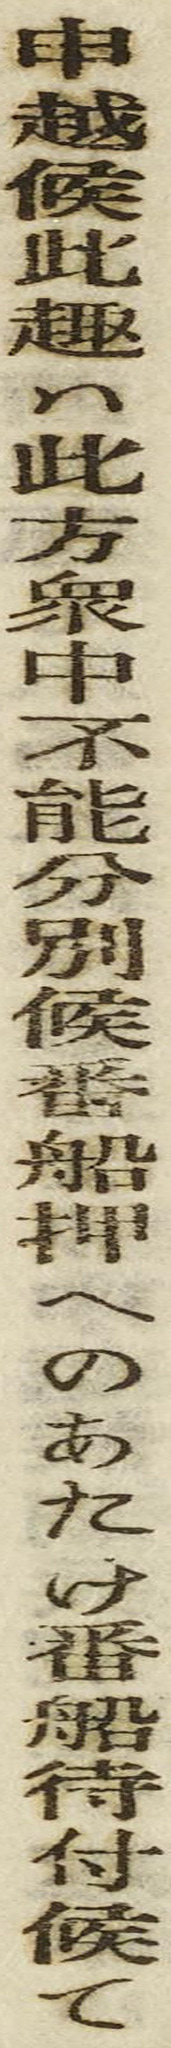申越候此趣ハ此方衆中不能分別候番船押へのあたけ番船待付候て
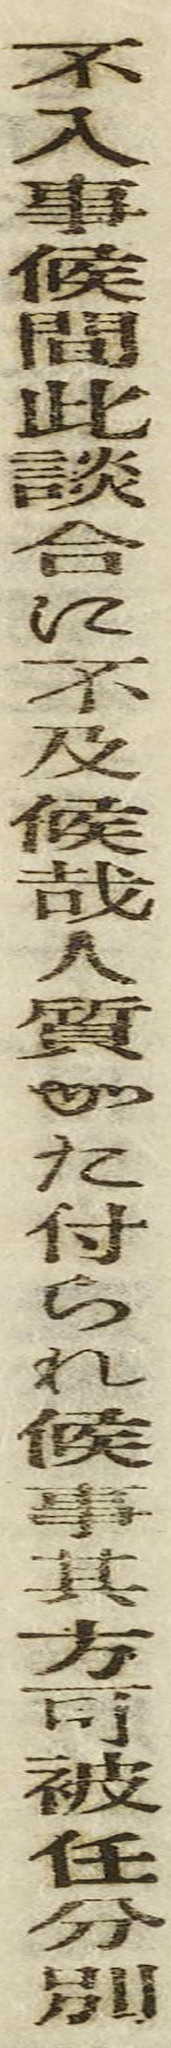不入事候間此談合に不及候哉人質かた付られ候事其方可被任分別
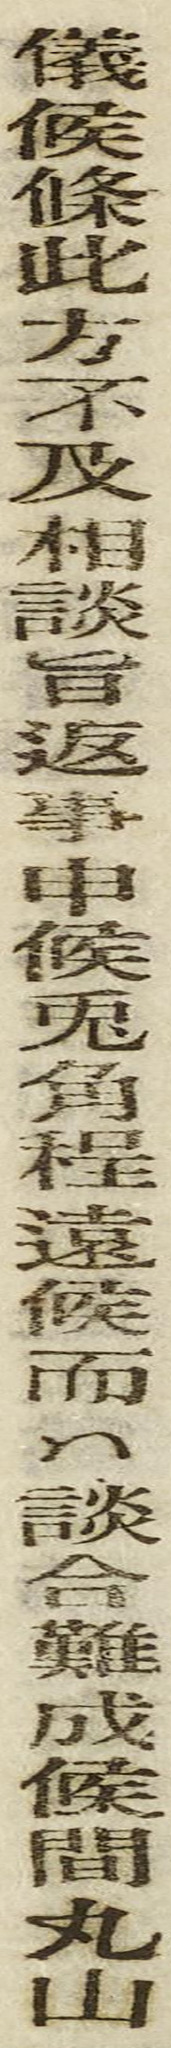儀候条此方不及相談旨返事申候兎角程遠候而ハ談合難成候間丸山
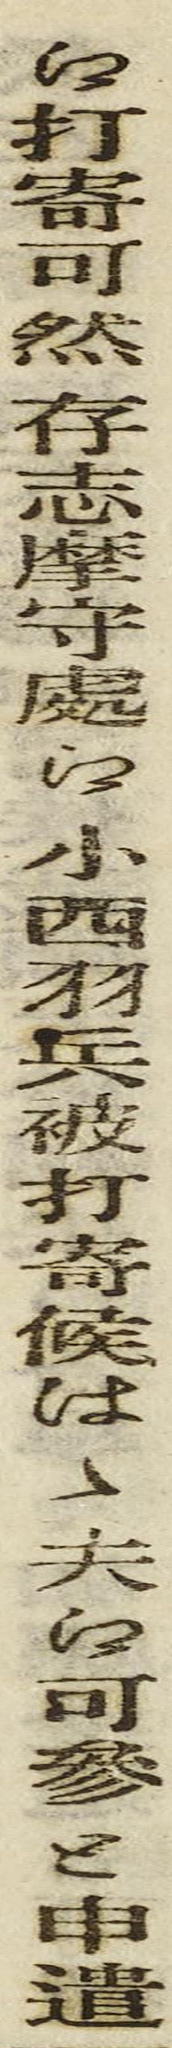え打寄可然存志摩守処え小西羽兵被打寄候はゝ夫え可参と申遣
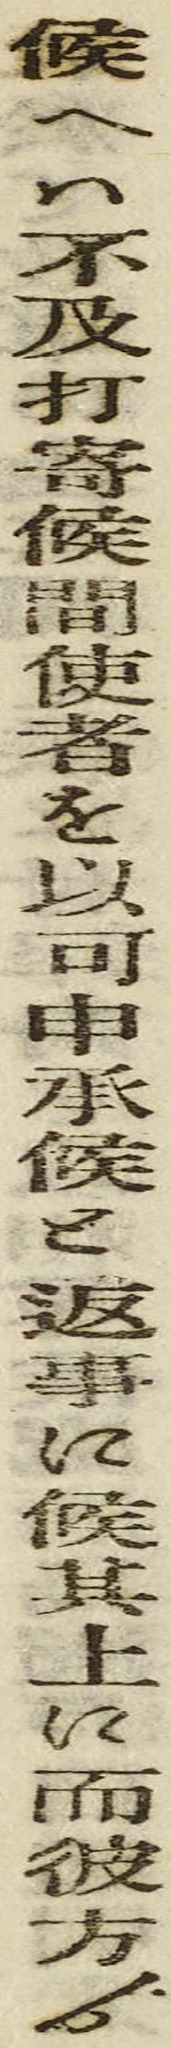候へハ不及打寄候間使者を以可申承候と返事に候其上に而彼方ゟ
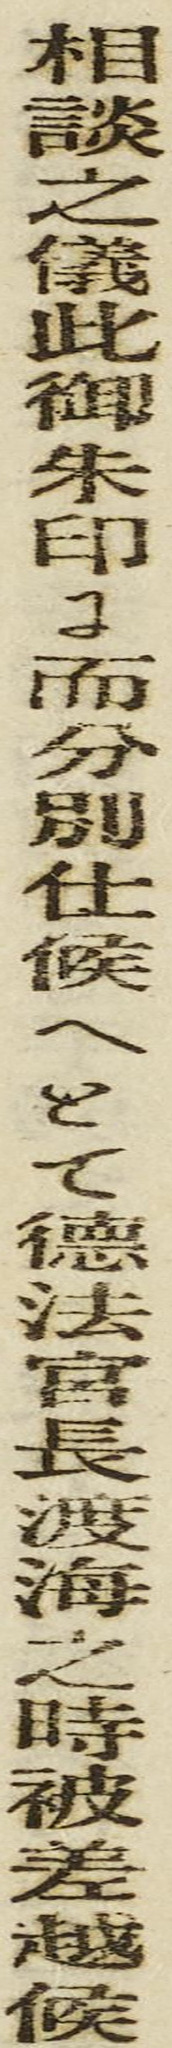相談之儀此御朱印に而分別仕候へとて徳法宮長渡海之時被差越候
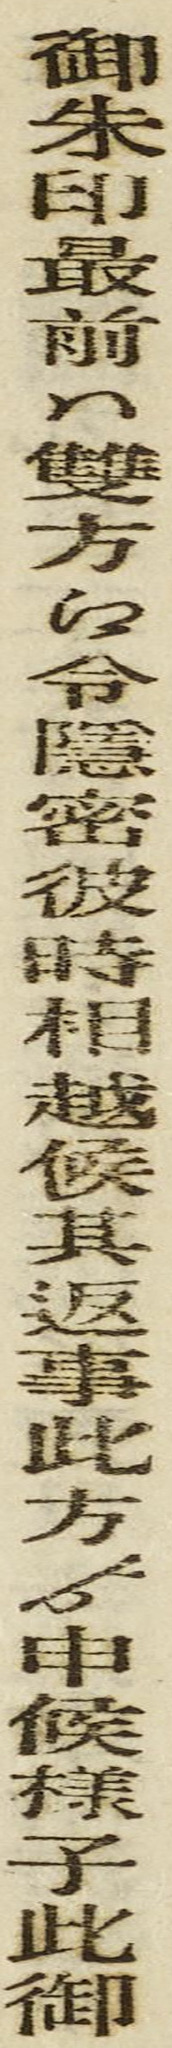御朱印最前ハ双方え令隠密彼時相越候其返事此方ゟ申候様子此御
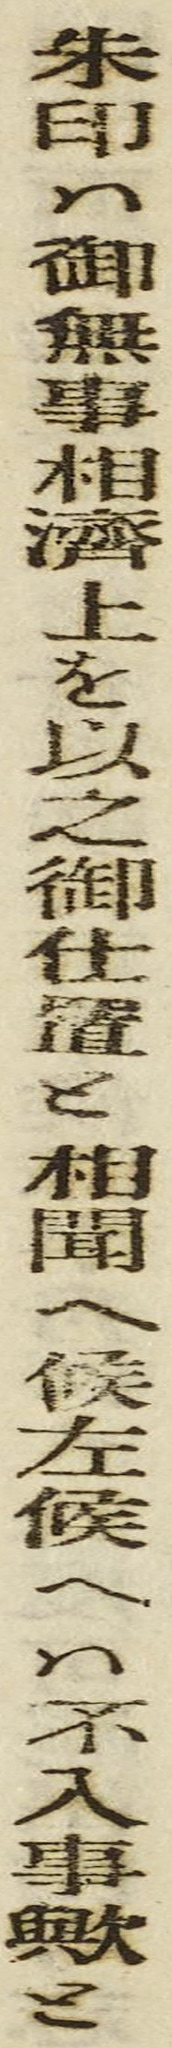朱印ハ御無事相済上を以之御仕置と相聞へ候左候へハ不入事歟と
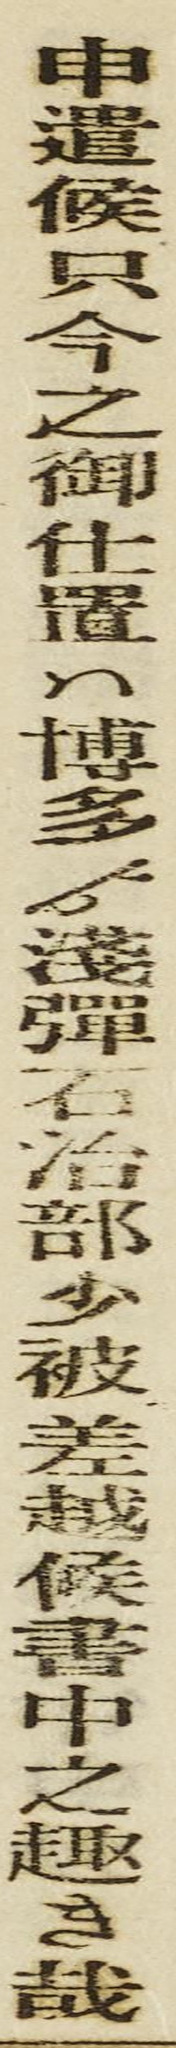申遣候只今之御仕置ハ博多ゟ浅弾石治部少被差越候書中之趣き哉
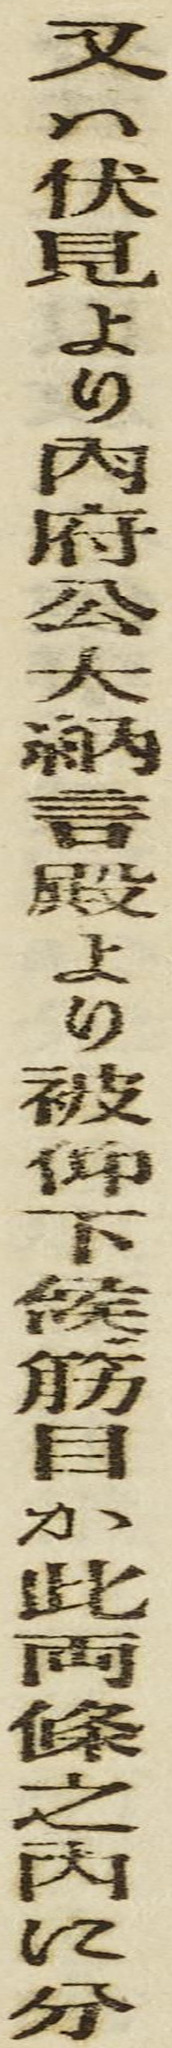又ハ伏見より内府公大納言殿より被仰下候筋目か此両条之内に分
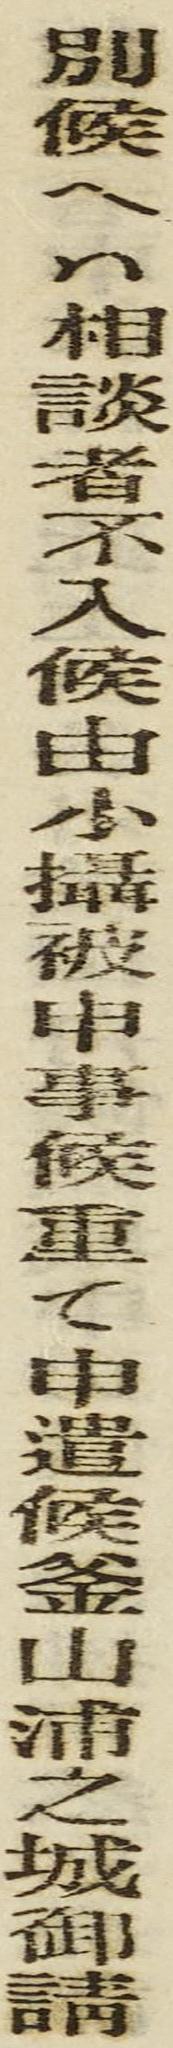別候へハ相談者不入候由小摂被申事候重て申遣候釜山浦之城御請
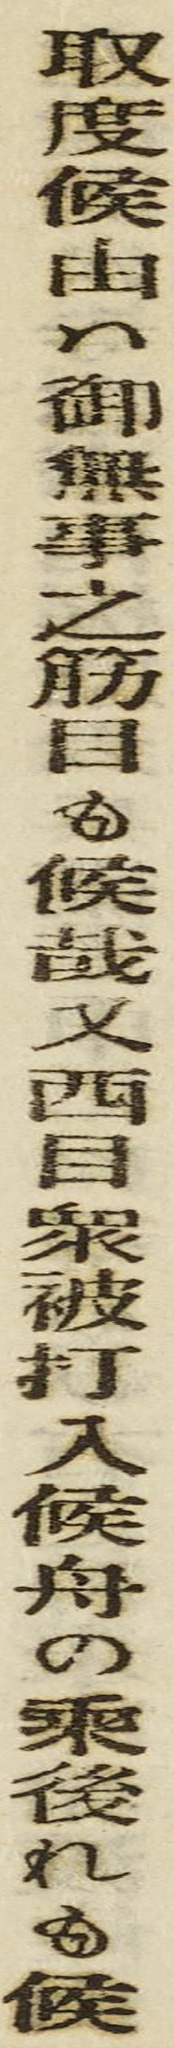取度候由ハ御無事之筋目も候哉又西目衆被打入候舟の乗後れも候
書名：史籍集覽　朝鮮陣古文・細井廣澤記・颶風紀事・天明七年將軍宣下次第書　全
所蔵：東京大学地震研究所図書室 Earthquake Research Institute Library, The University of Tokyo, JAPAN
